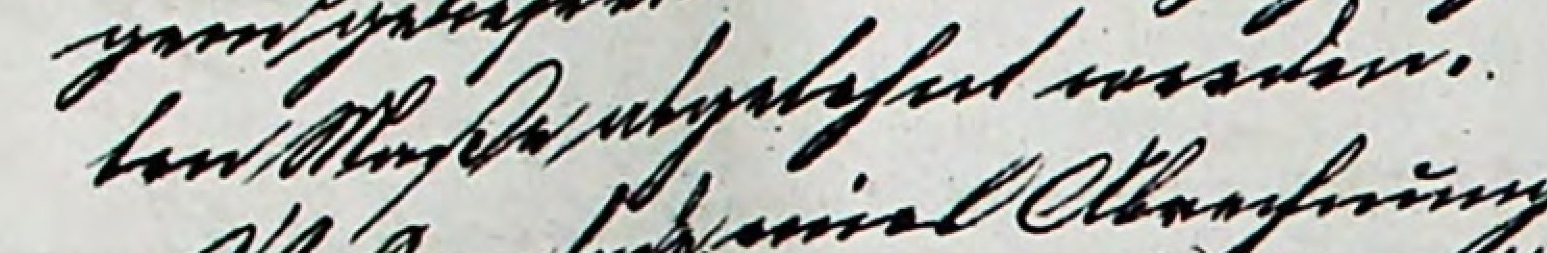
ten Maße abgelehnt werden.
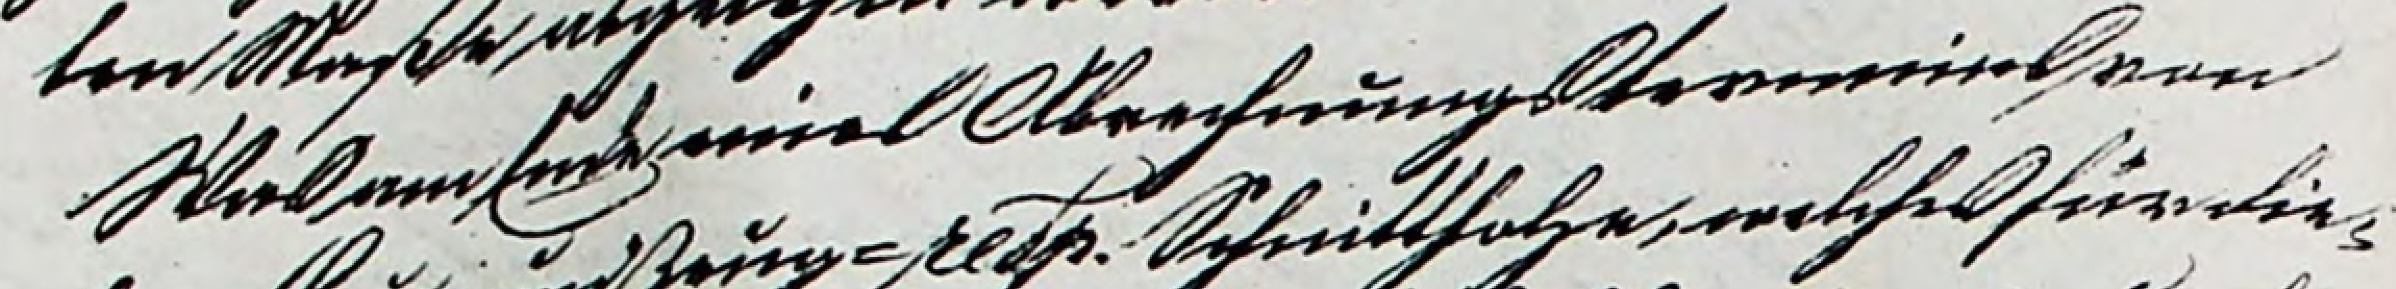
Was an Ende eines Abrechnungstermines von
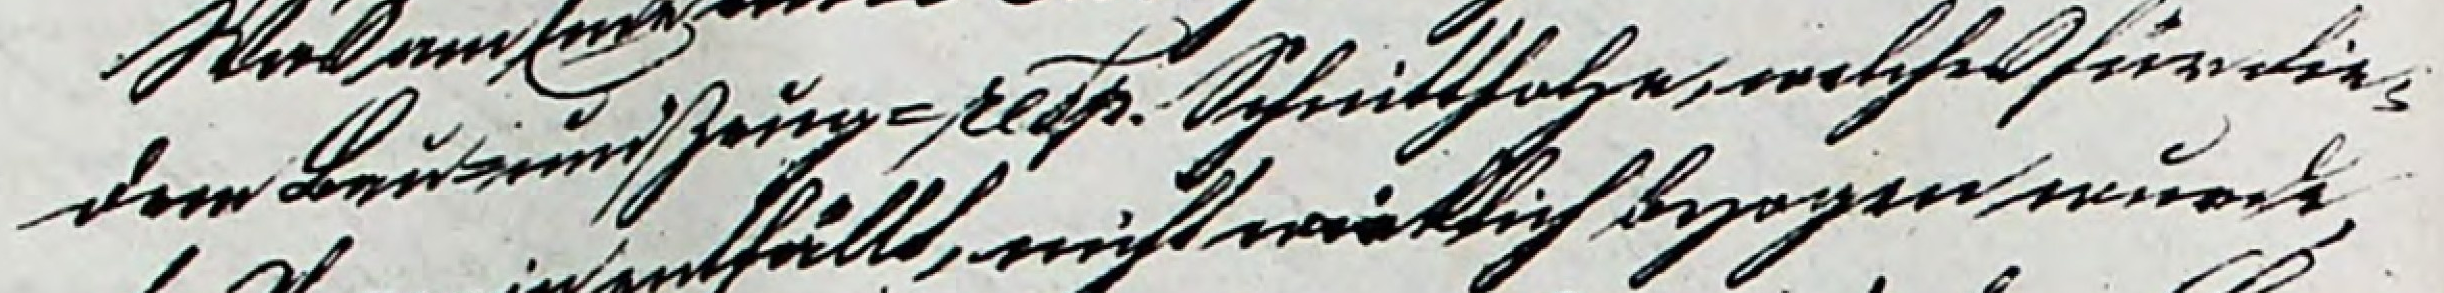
dem Bau= und Zeug = resp. Schnittholze, welches für die„
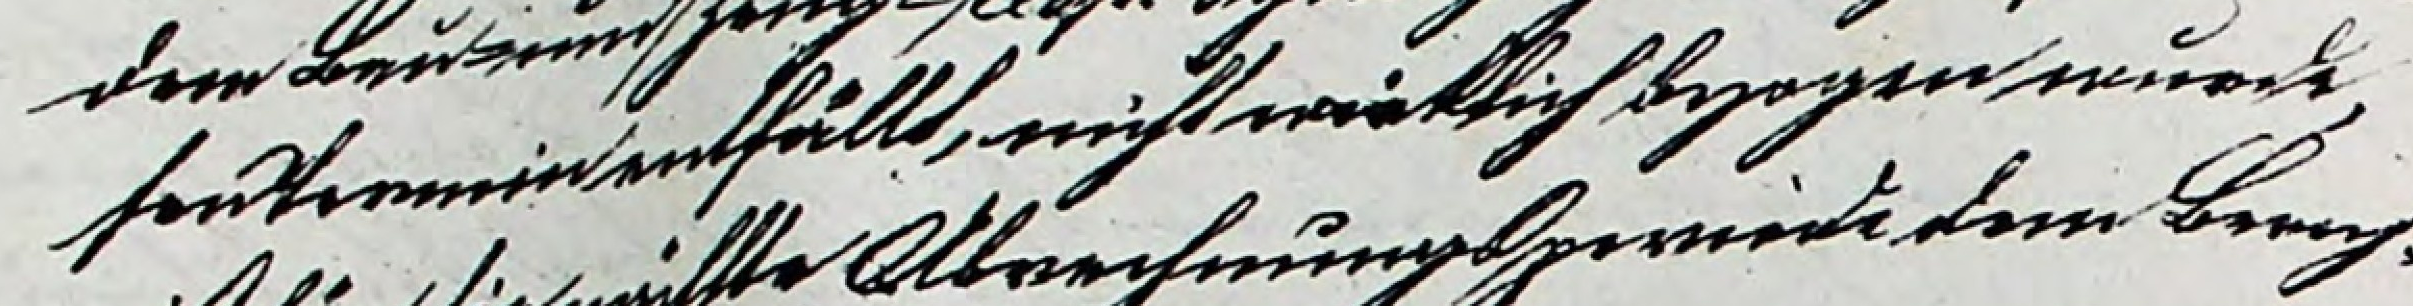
sendtermin entfällt, nicht wirklich bezogen wurde,
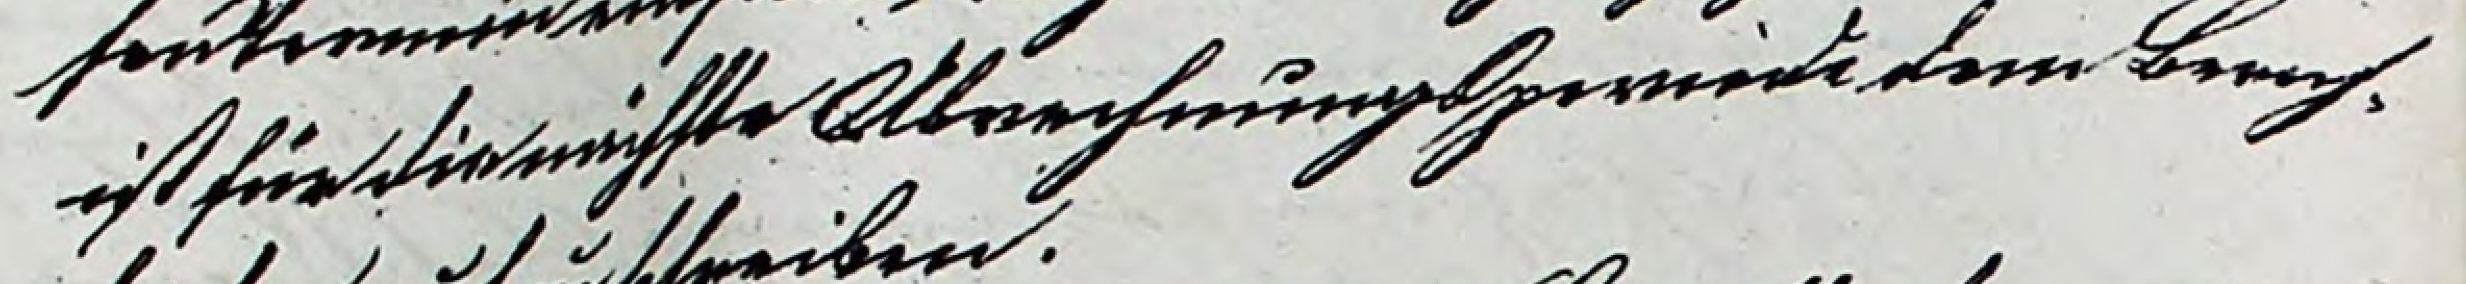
ist für die nächste Abrechnungsperiede dem Berech„
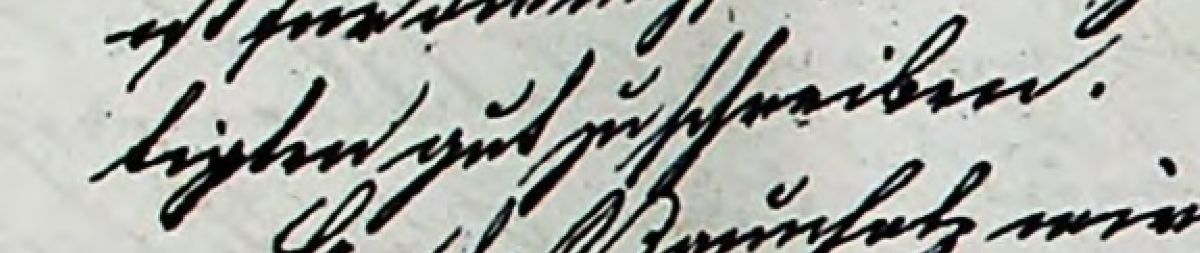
tigten gut zuschreiben.
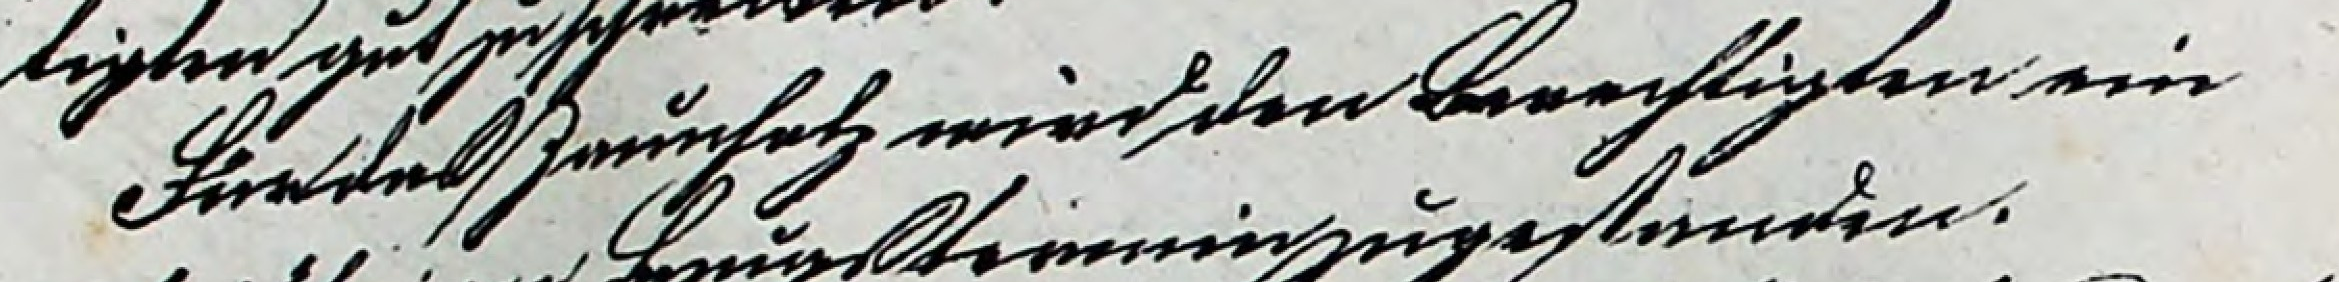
Für das Zaunholz wird den Berechtigten ein
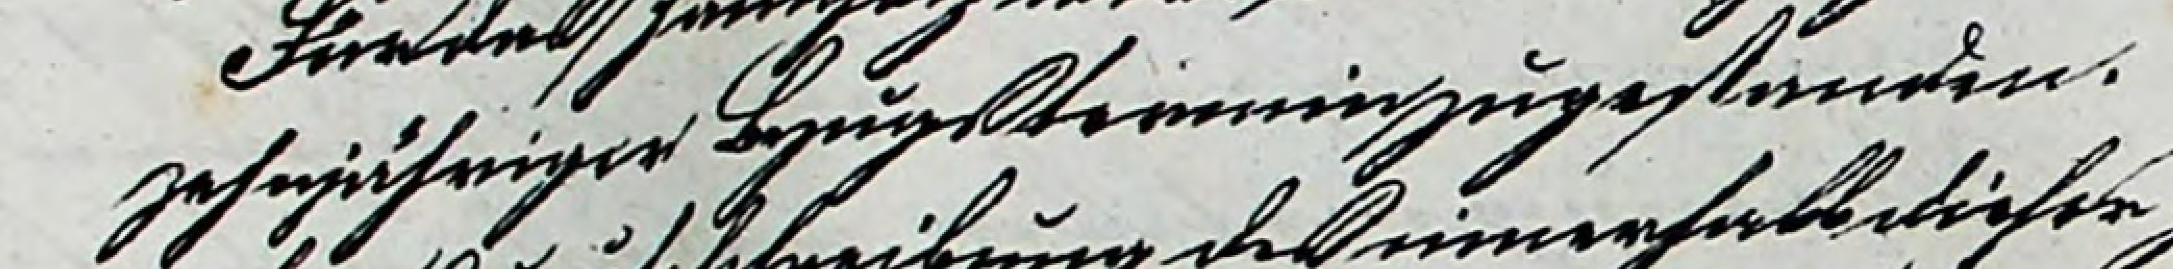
zehnjähriger Bezugsterminzugestanden.
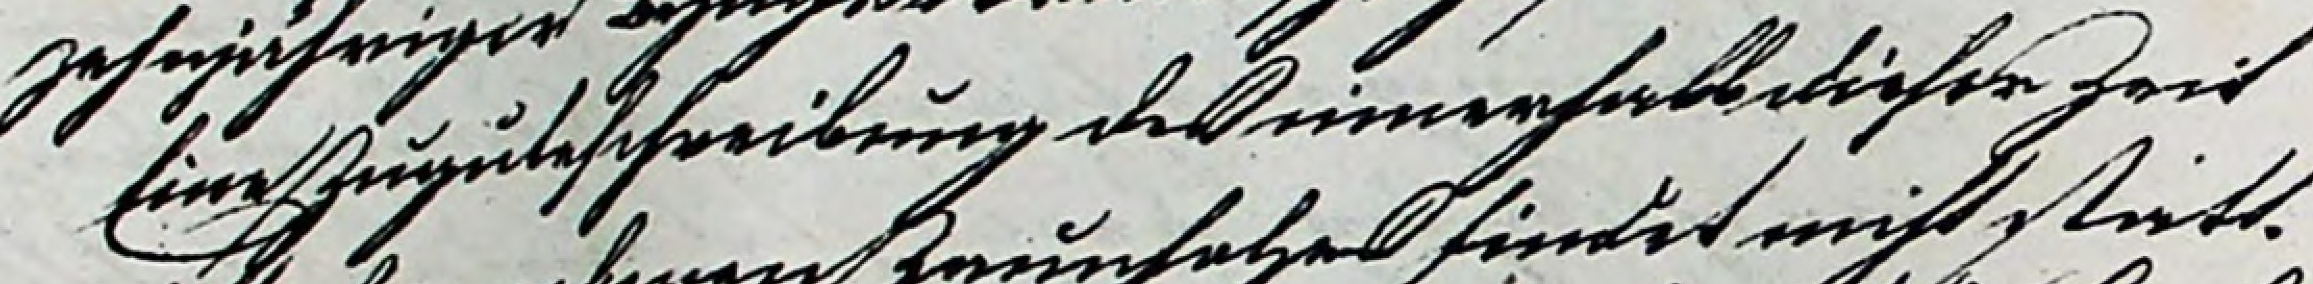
Eine Zuguteschreibung des innerhalb dieser Zeit
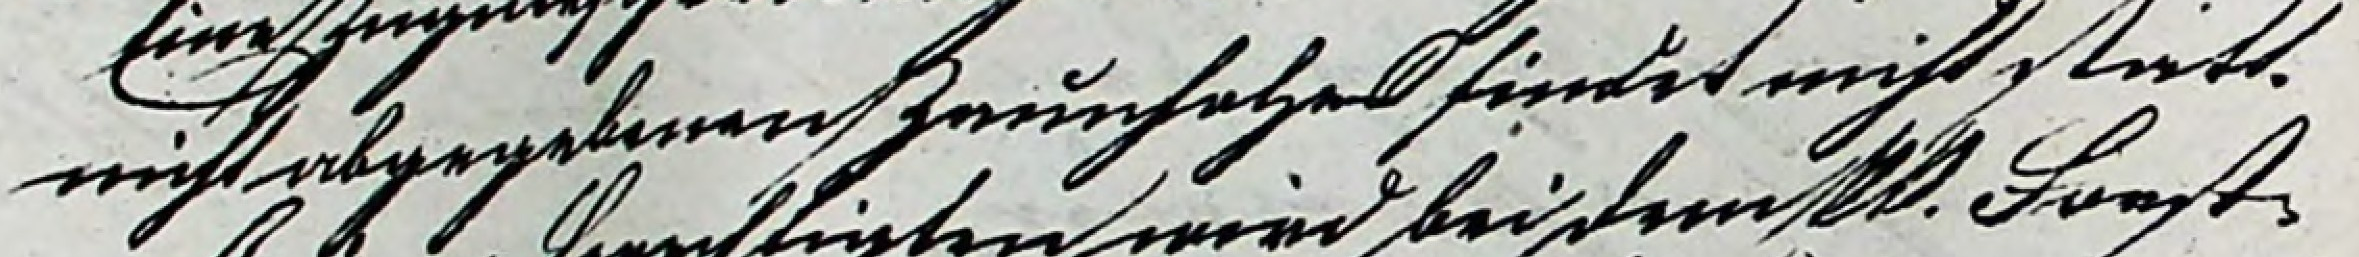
nicht abgegebenen Zaunholze findet nicht statt.
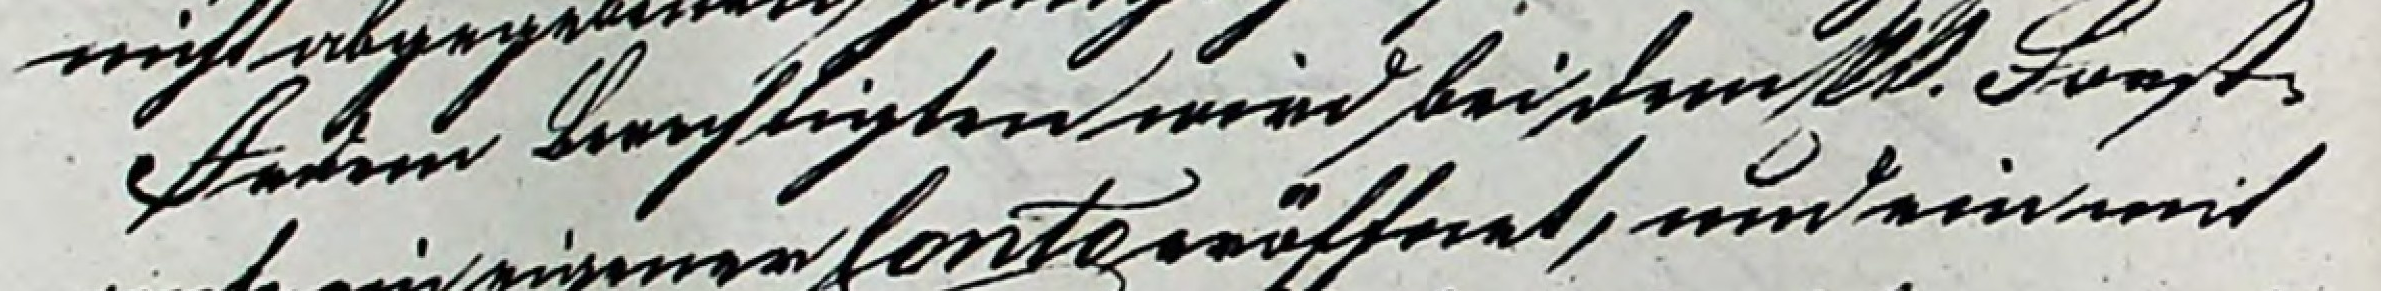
Jedem Berechtigten wird bei dem kk. Forst„
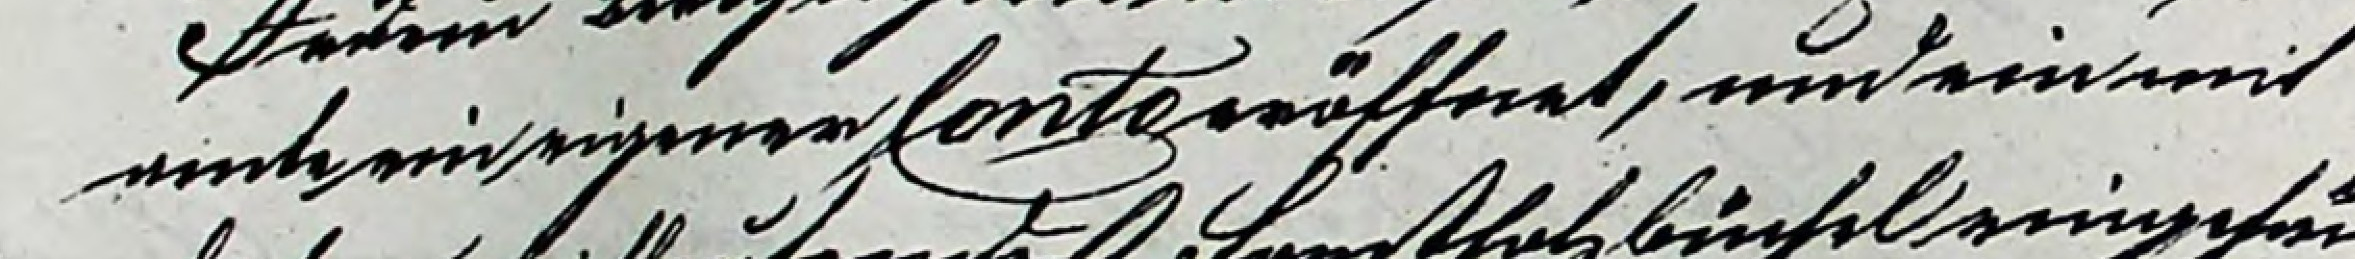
amte ein eigener Conte eröffnet, und ein mit
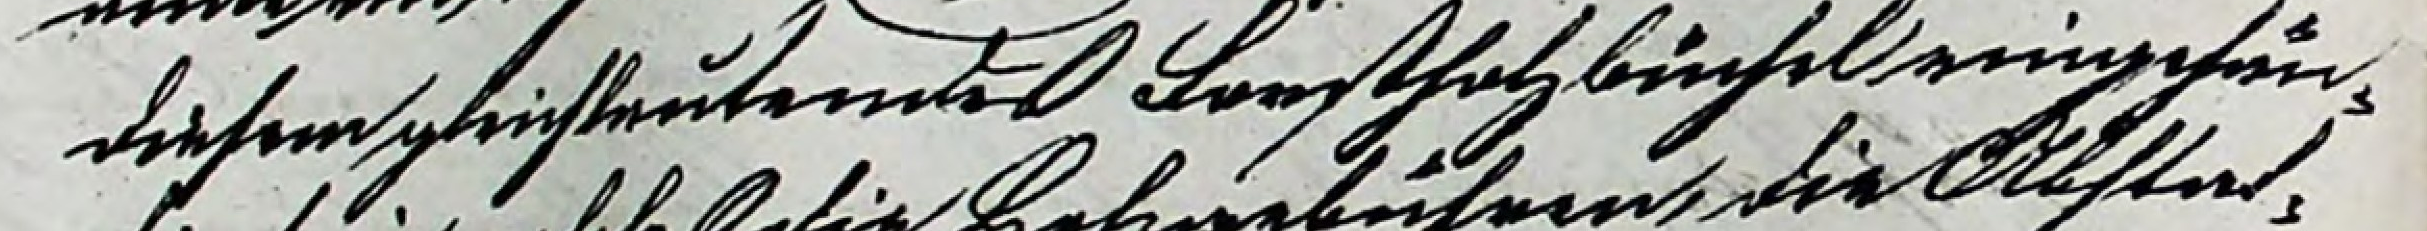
diesem gleichtautendes Forstholzbüchel eingehän„
